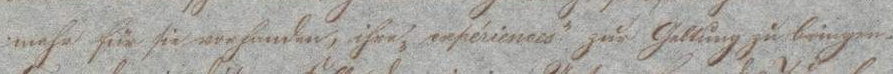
mehr für sie vorhanden, ihre «expériences» zur Geltung zu bringen.
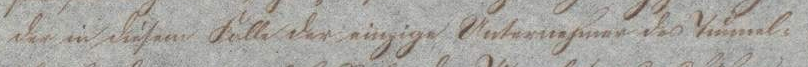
der in diesem Falle der einzige Unternehmer des Tunnel-
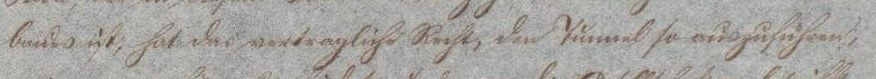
baues ist, hat das vertragliche Recht, den Tunnel so auszuführen,
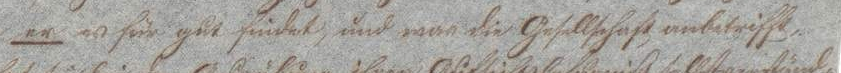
wie, er es für gut findet, und was die Gesellschaft anbetrifft,
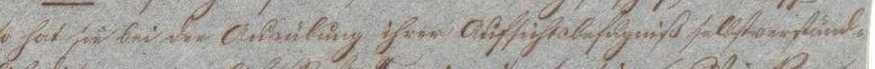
so hat sie bei der Ausübung ihrer Aufsichtsbefugniß selbstverständ-
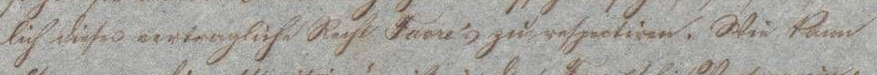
lich dieses vertragliche Recht Favre's zu respectiren. Wie kann
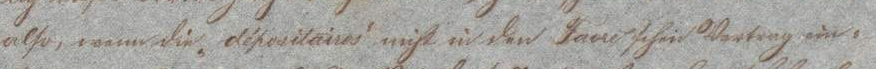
also, wenn die «dépositaires» nicht in den Favre'schen Vertrag ein-
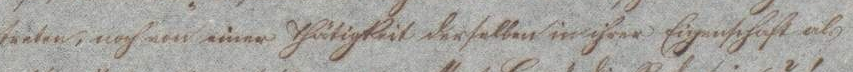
treten, noch von einer Thätigkeit derselben in ihrer Eigenschaft als
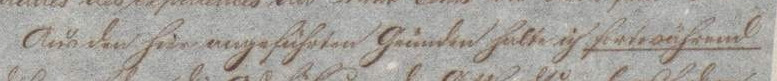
Aus den hier angeführten Gründen halte ich fortwährend
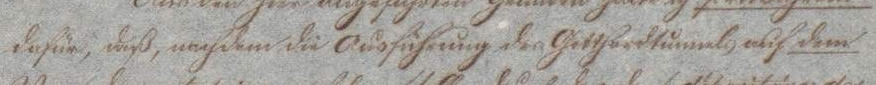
dafür, daß, nachdem die Ausführung des Gotthardtunnels auf dem
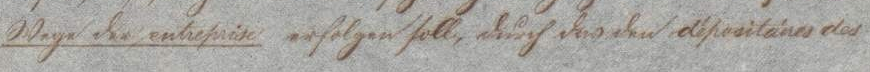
Wege der entreprise erfolgen soll, durch das den dépositaires des
